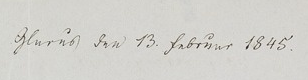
Glarus den 13. Februar 1845.
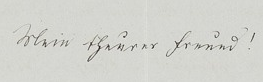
Mein theurer Freund!
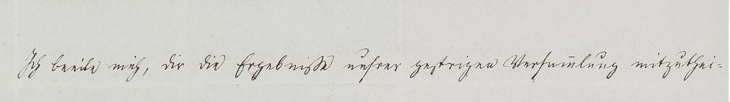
Ich beeile mich, Dir die Ergebnisse unsrer gestrigen Versammlung mitzuthei-
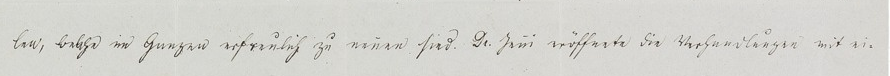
len, welche im Ganzen erfreulich zu nennen sind. Dr. Jenni eröffnete die Verhandlungen mit ei-
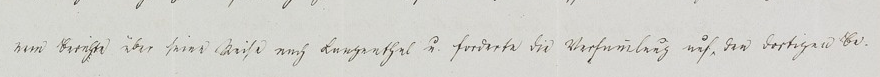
nem Berichte über seine Reise nach Langenthal u. forderte die Versammlung auf, den dortigen Be-
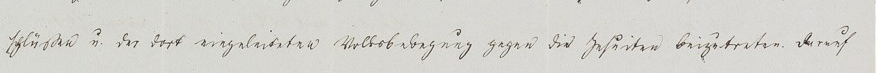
schlüssenu. der dort eingeleiteten Volksbewegung gegen die Jesuiten beizutreten. Darauf
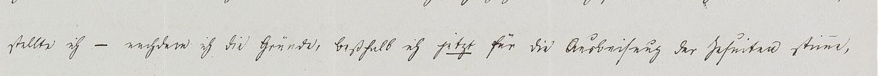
stellte ich – nachdem ich die Gründe, weßhalb ich jetzt für die Ausweisung der Jesuiten stimme,
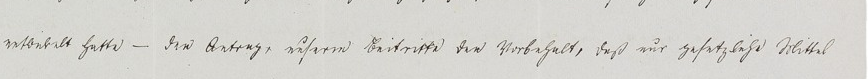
entwickelt hatte – den Antrag, unserm Beitritte den Vorbehalt, daß nur gesetzliche Mittel
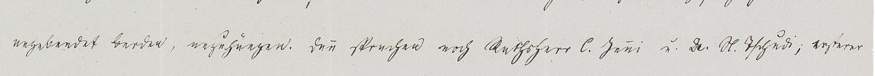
angewendet werden, anzuhängen. Dann sprachen noch Rathsherr C. Jenni u. Dr. N. Tschudi; ersterer
